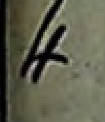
4
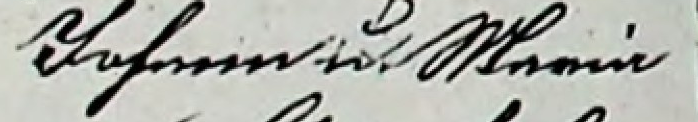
Johann u. Maria
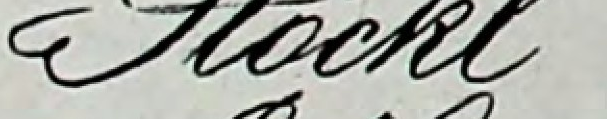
Stöckl
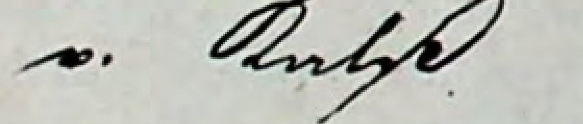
v. Kalß
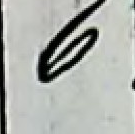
6
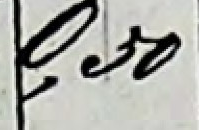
0,50
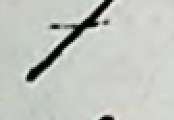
7
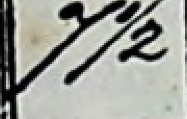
7 ½
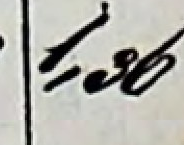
1,36
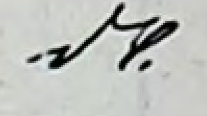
do
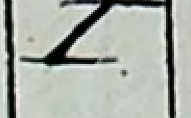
I
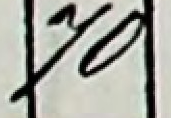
70
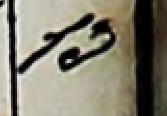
13
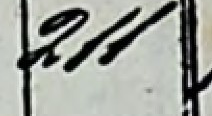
211
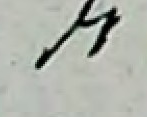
do
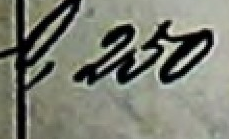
0,250
